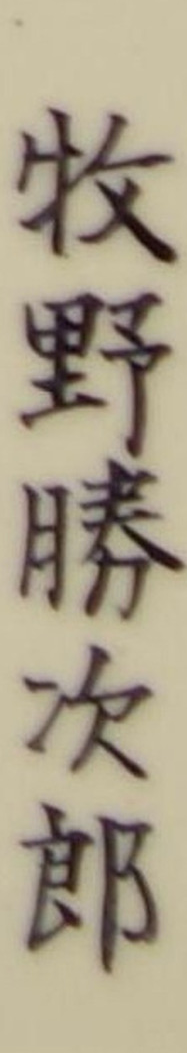牧野勝次郎
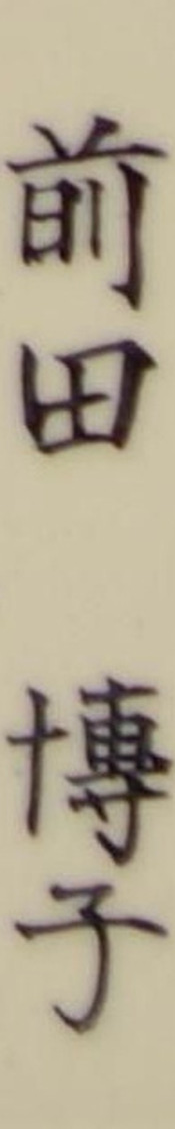前田博子
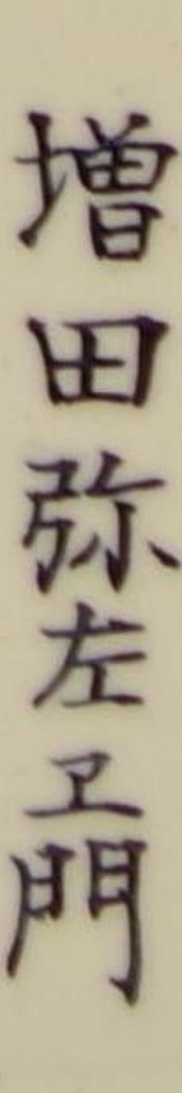増田弥左ヱ門
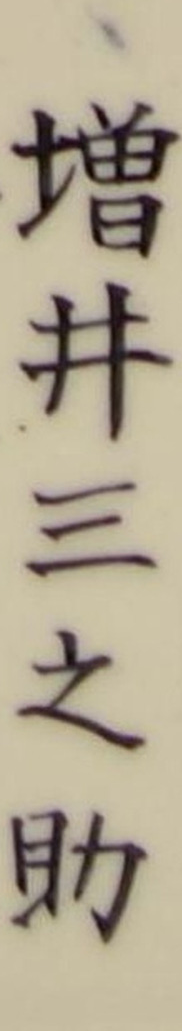増井三之助
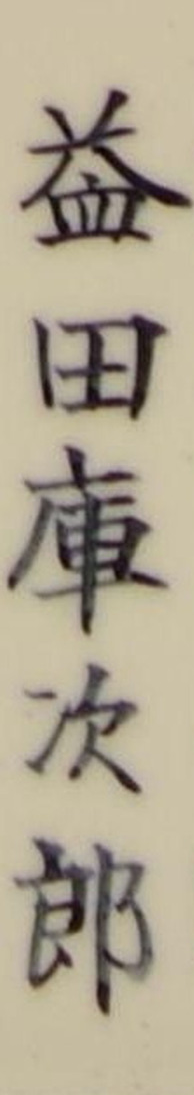益田庫次郎
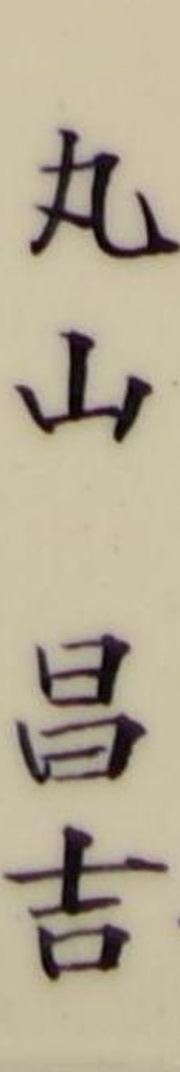丸山昌吉
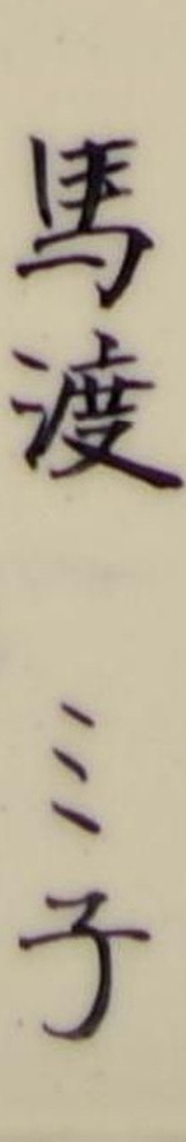馬渡ミ子
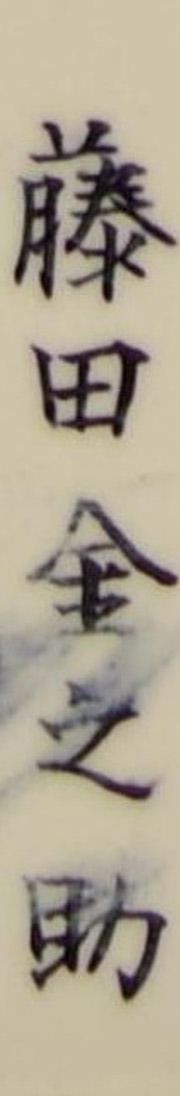藤田金之助
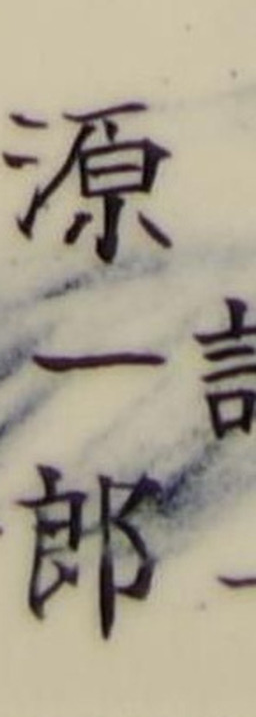源一郎
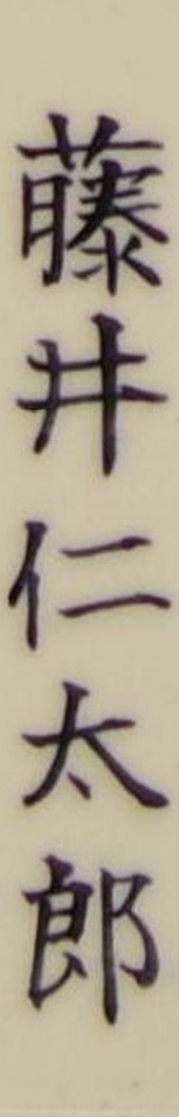藤井仁太郎
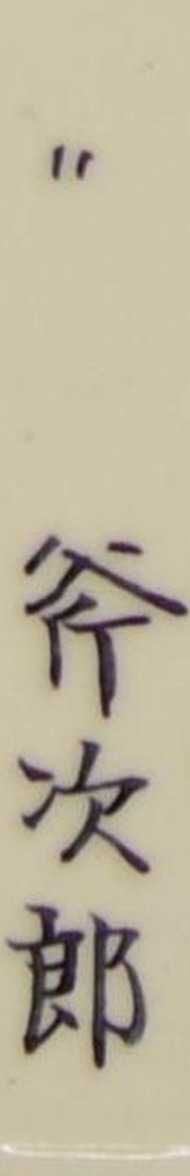斧次郎
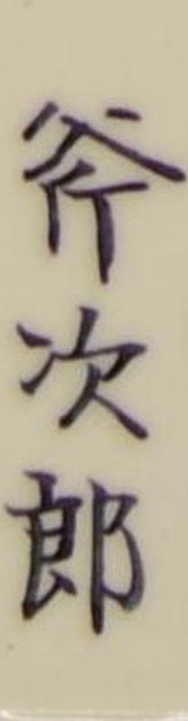斧次郎
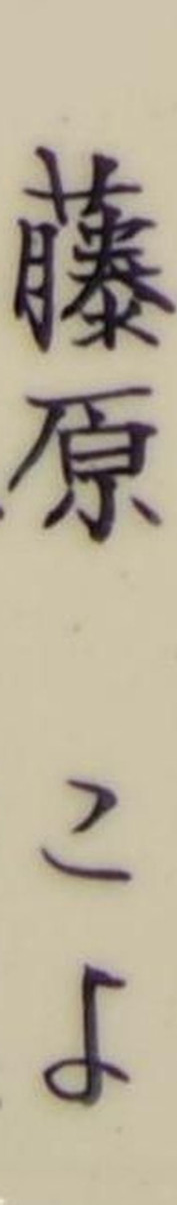藤原こよ
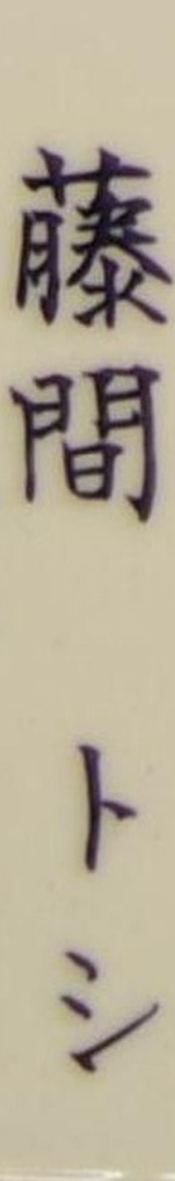藤間トシ
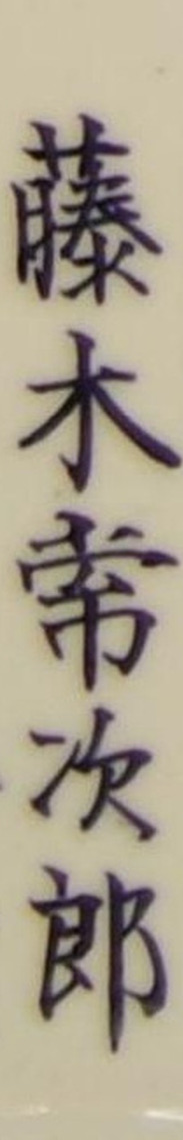藤木常次郎

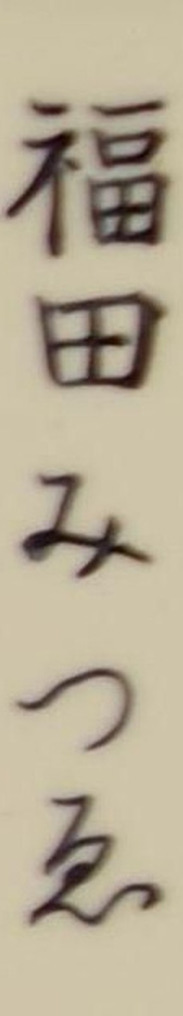福田みつえ
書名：E~L
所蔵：高野山金剛峯寺
